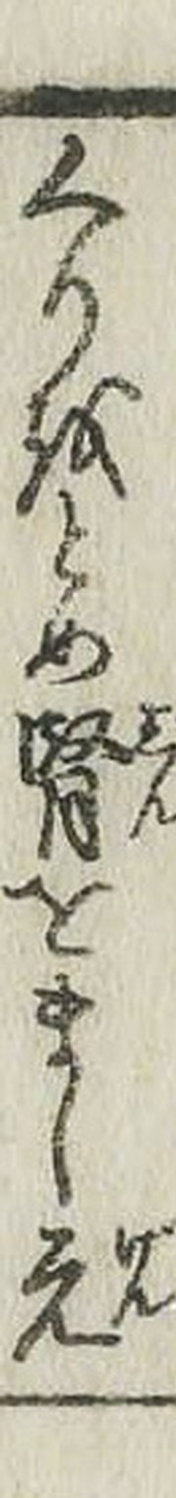くりをとめ腎をまし元
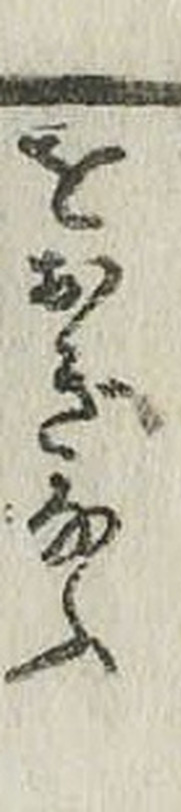をおぎなふ
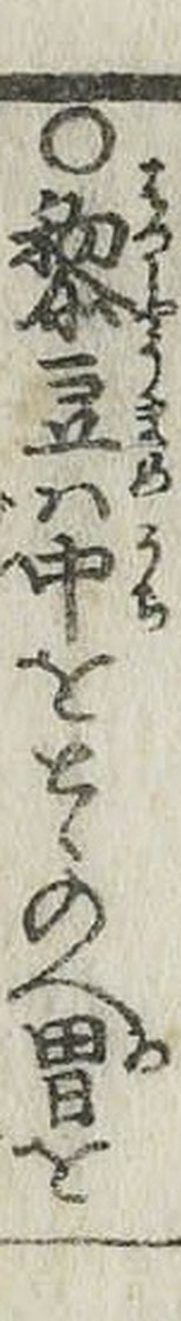○黎豆は中をとゝのへ胃を
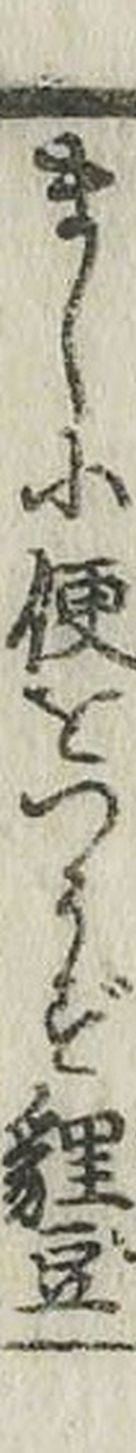まし小便をつうず狸豆

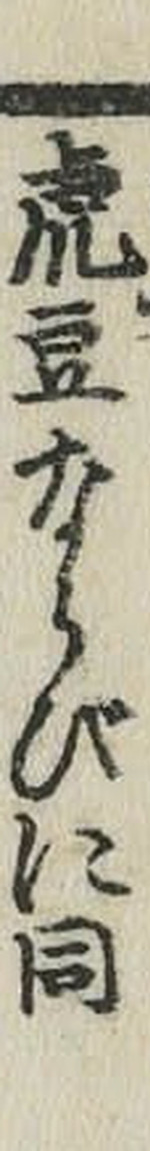虎豆ならびに同
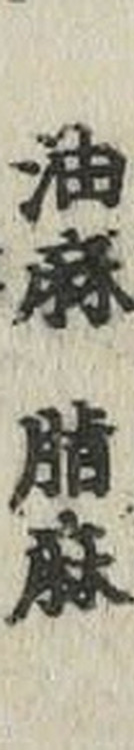油麻脂麻
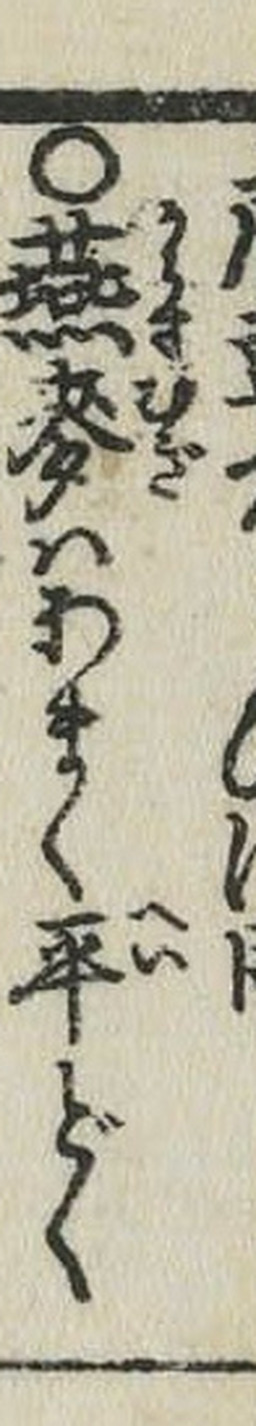○燕麦はあまく平どく
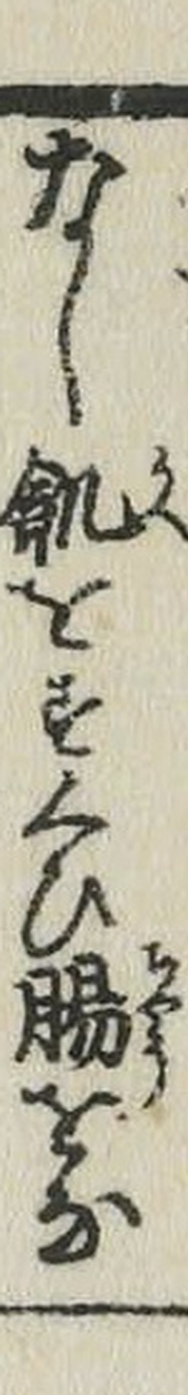なし飢をすくひ腸をな
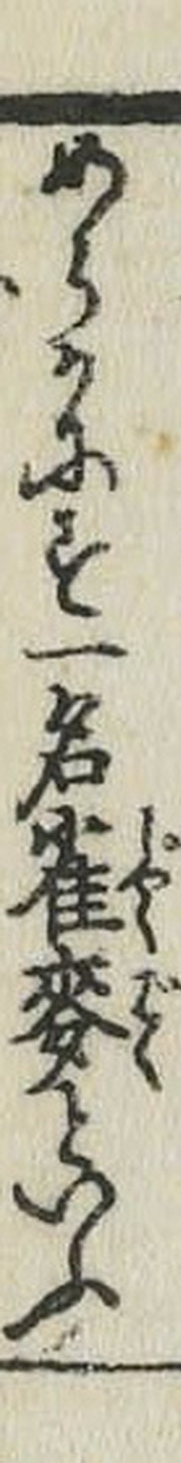めらかにす一名雀麦といふ
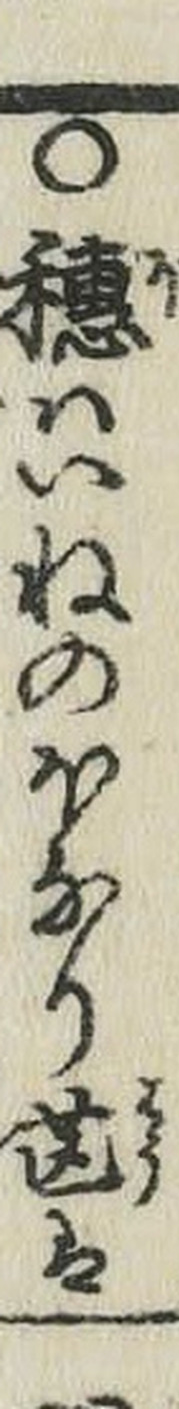○穂はいねのほなり芒は
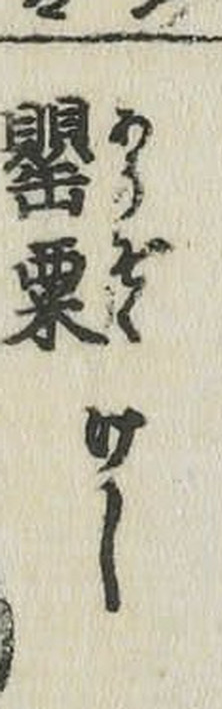罌粟けし
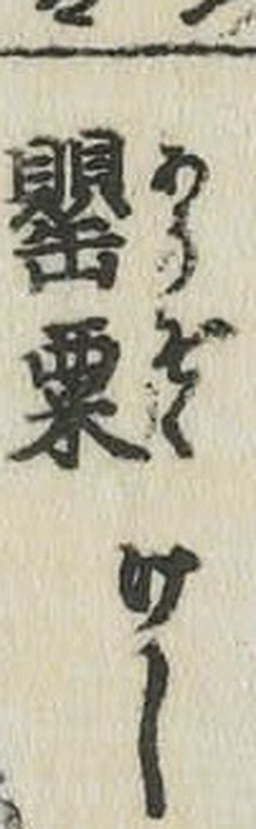罌粟けし
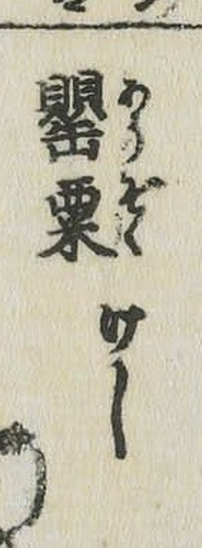罌粟けし
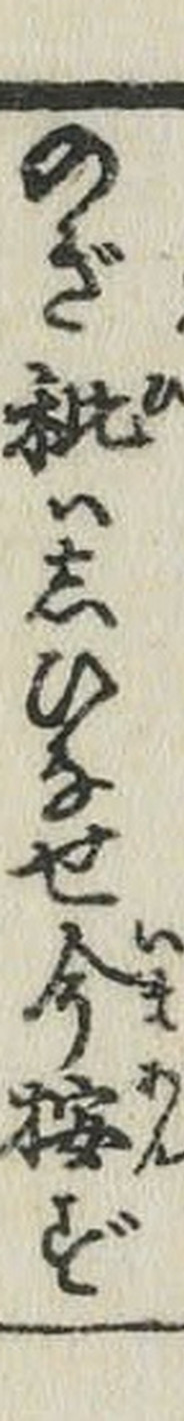のぎ秕はしひなせ今按ず
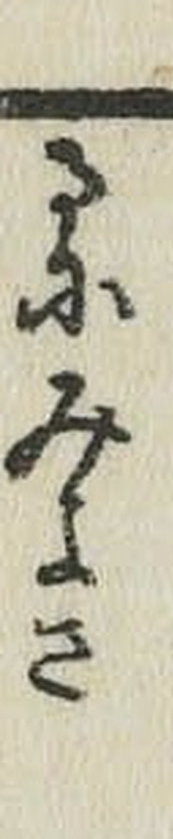るにみよさ
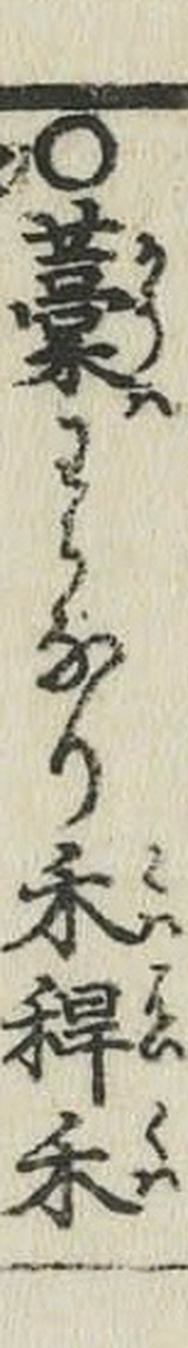○藁はわらなり禾稈禾
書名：増補頭書訓蒙図彙大成 10巻 7:巻之14-16
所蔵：東京学芸大学教育コンテンツアーカイブ
